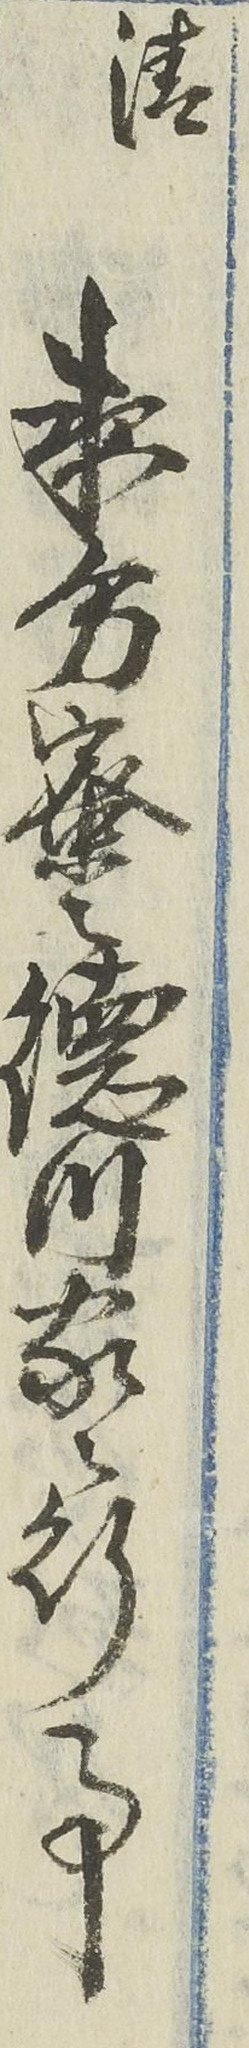清夜分密ニ徳川家二行事
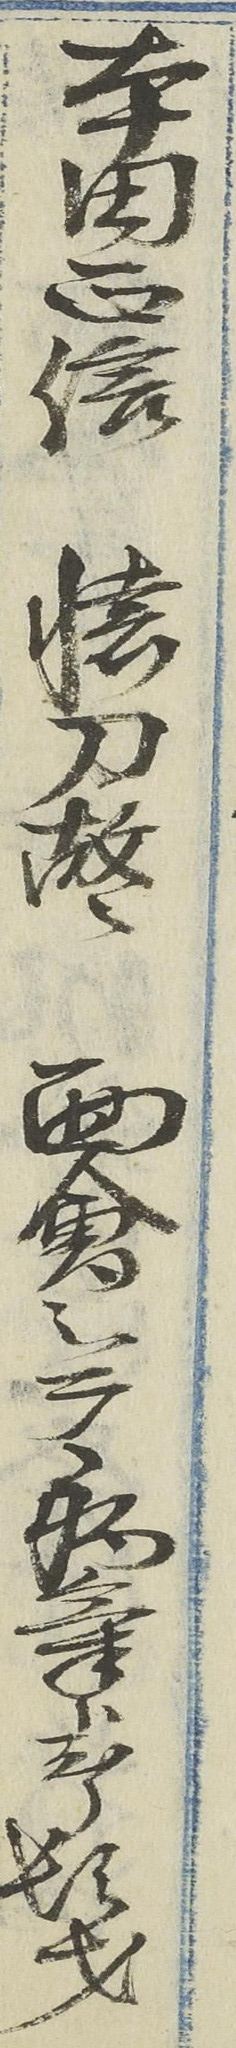本田正信懐刀故ニ面會シテ病気ト云ウ頓才

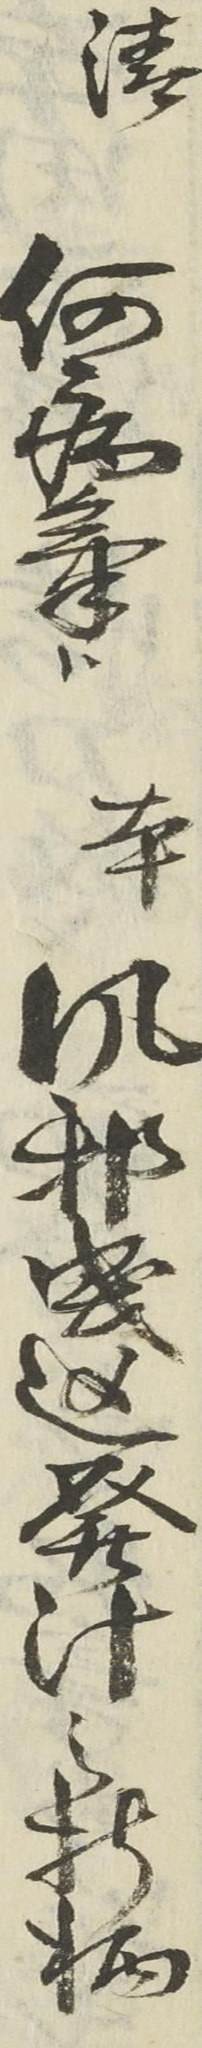清何病気ト本風邪曳込発汗之折柄
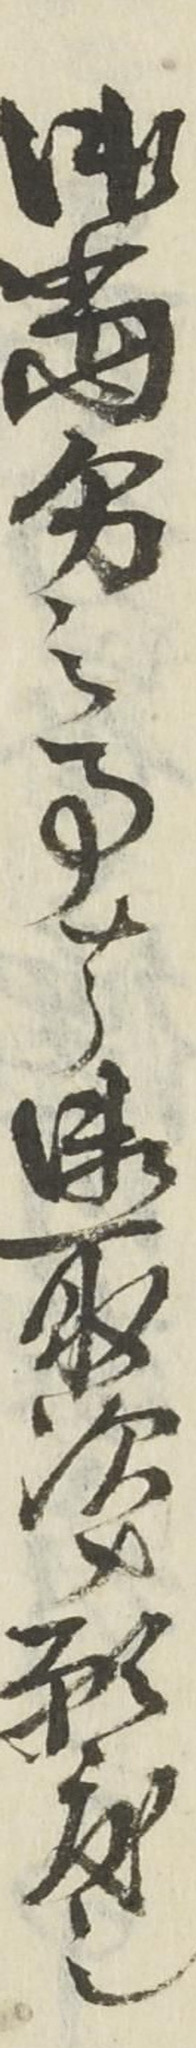清御当分之事ナリ御取次ヲ願度シ
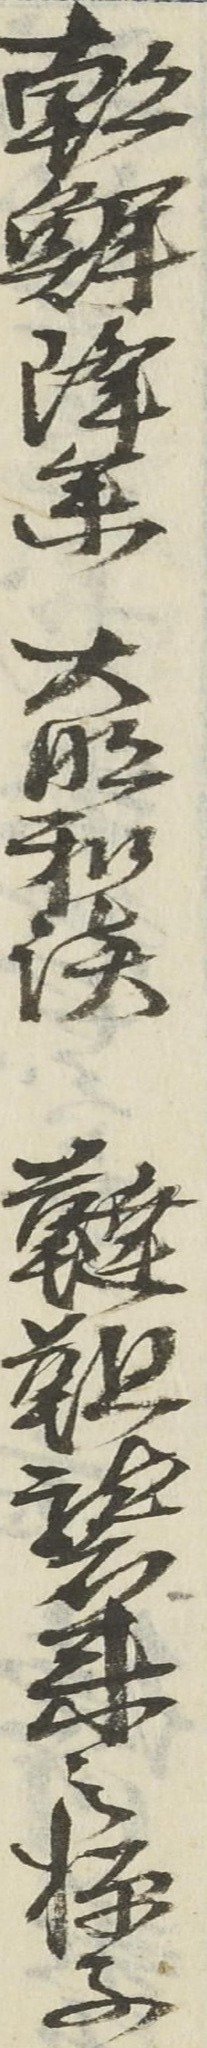朝鮮降参大明和談韃靼襲来之様子
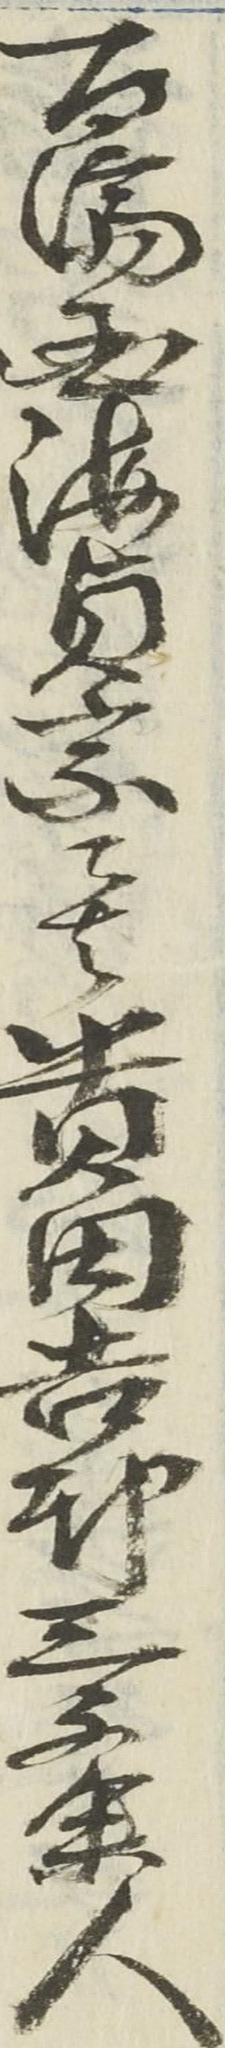百済国海貞宗ハ貴田吉邨三千余人
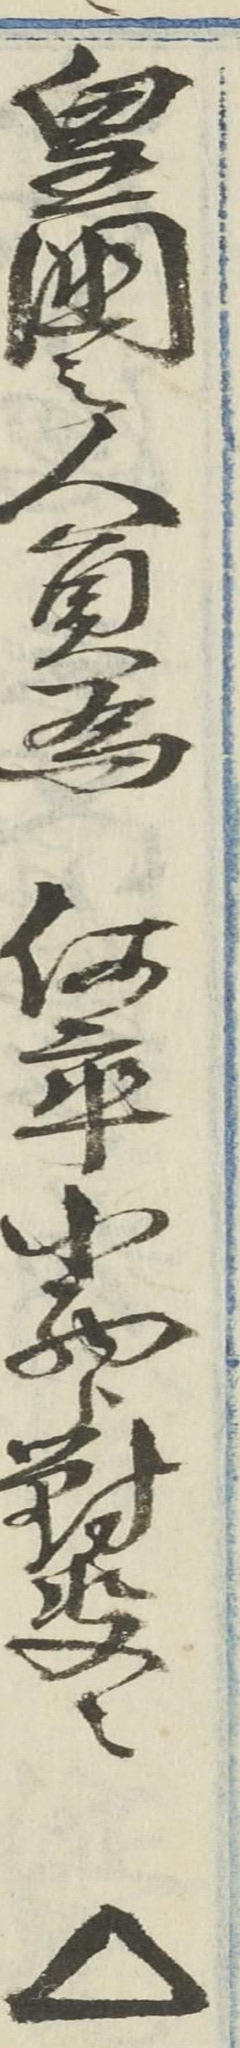皇国之人員為何卒小西ト対決之△
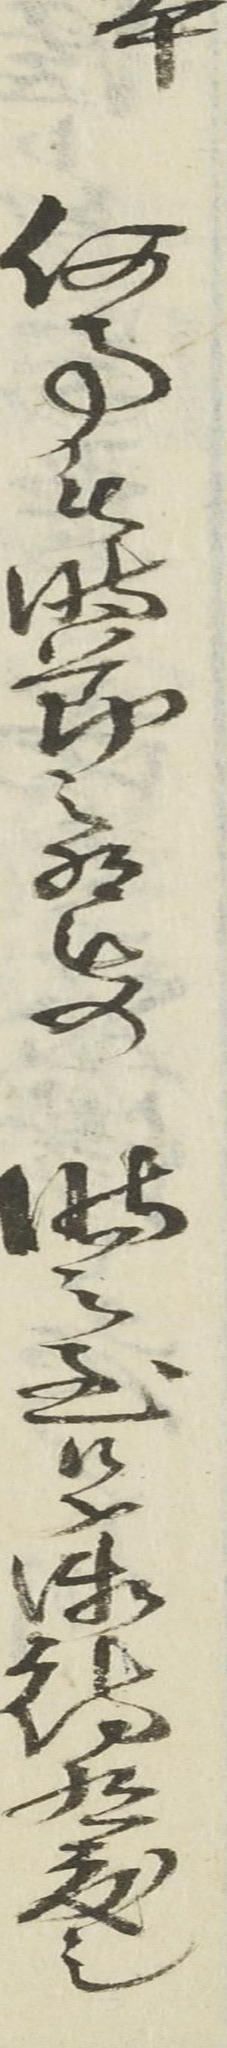本何事モ時節之有モノ時之至ルヲ御待有度シ
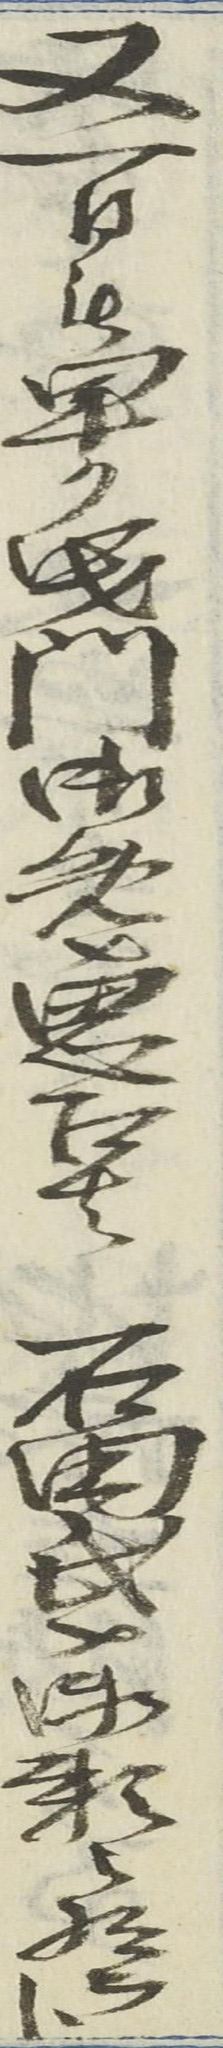又一日モ早ク閉門御免ヲ思召ハ石田氏ヲ御頼二有テト
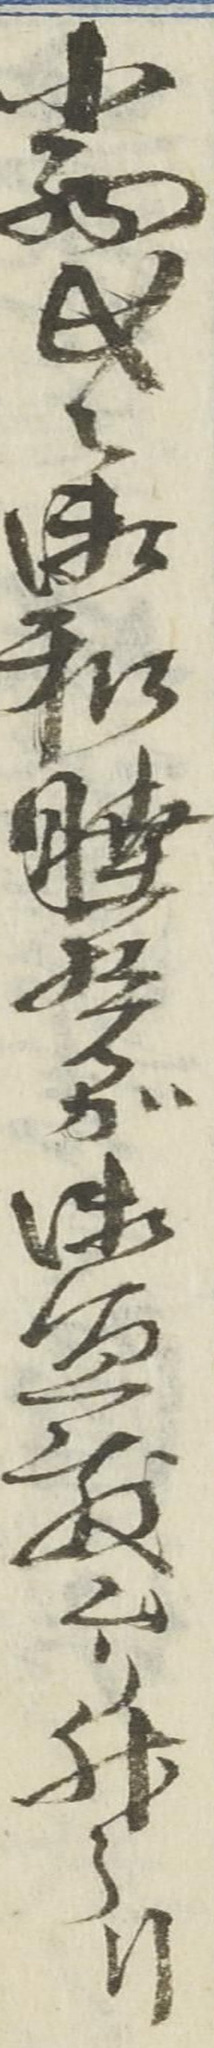小西氏ニ御和睦有ルガ御宣敷ムリ升
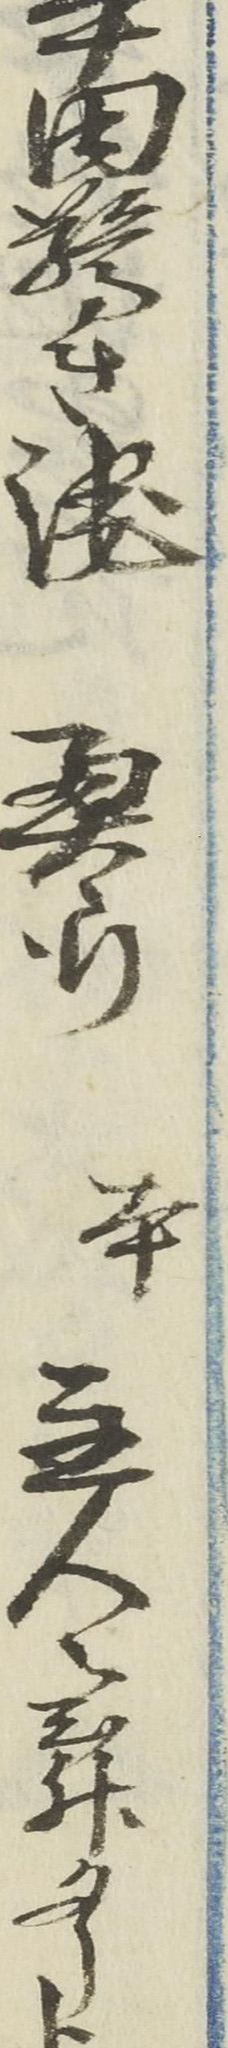本田驚キ詫奥二行本主人ニ云升タリト
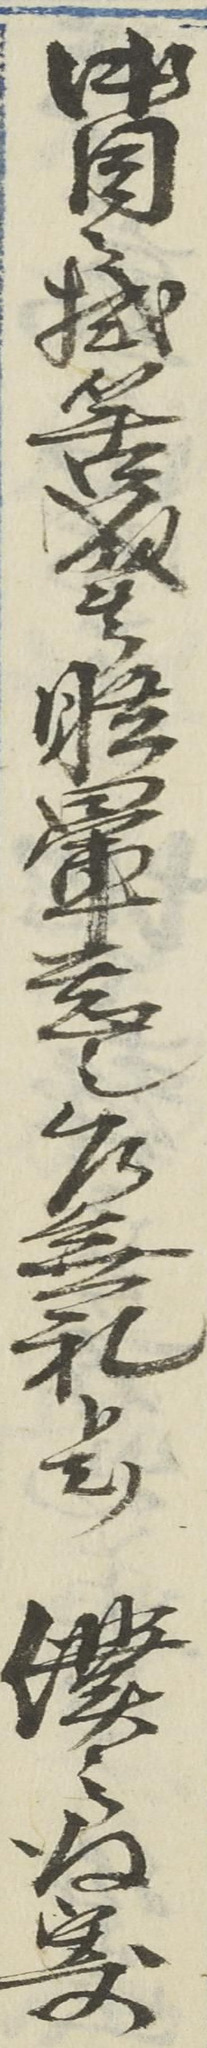御目二掛筈成共眩暈起シ乍無礼ト云僕之存寄
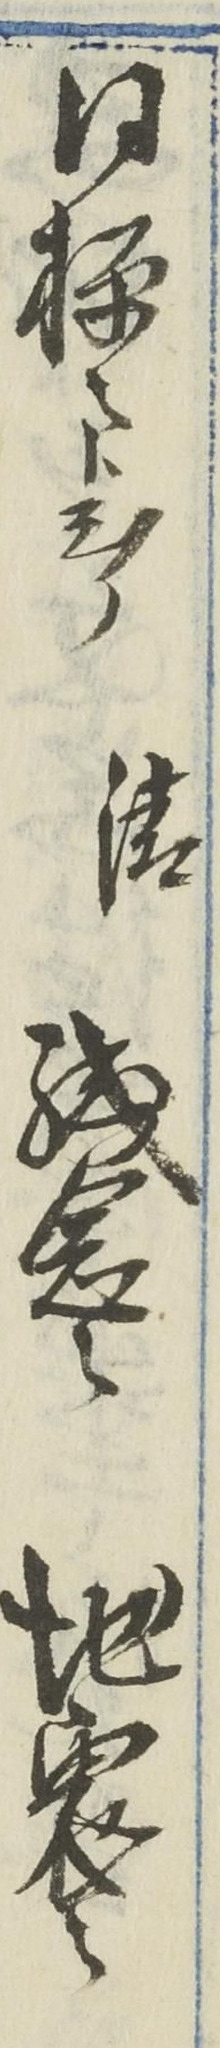同様ニト云ウ清残念之地震之
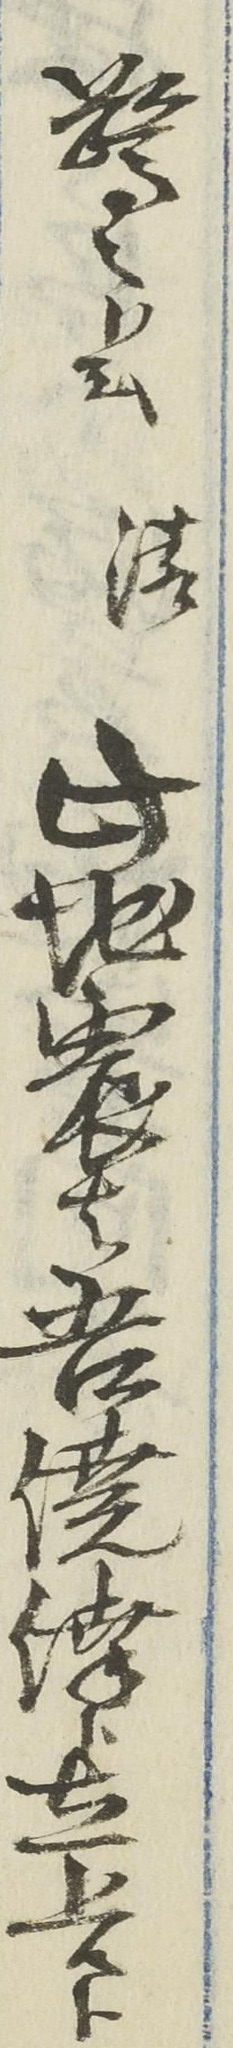皆々驚之ト云清此地震ハ吾僥倖ト立上ルト
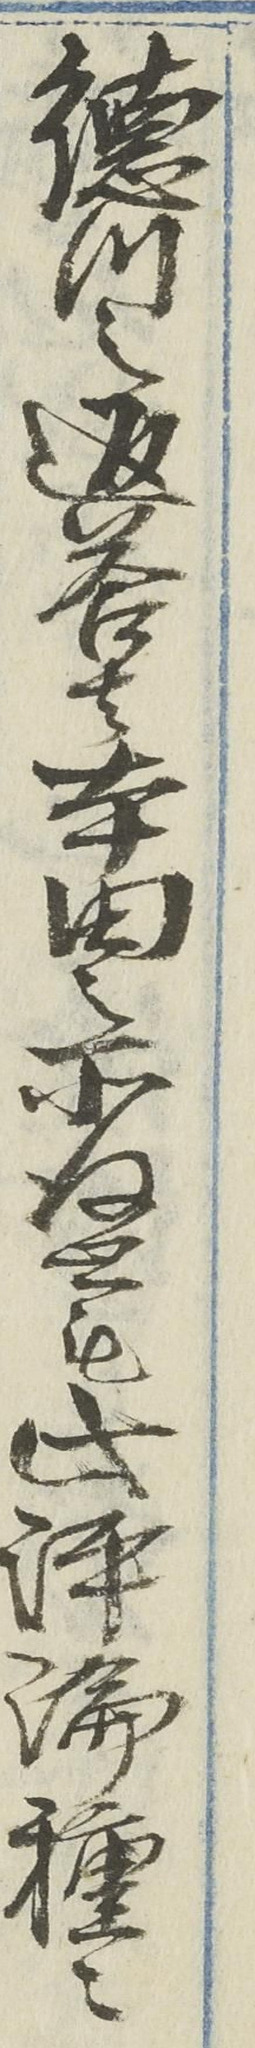徳川之返答ハ本田之所存とモ此評論種々
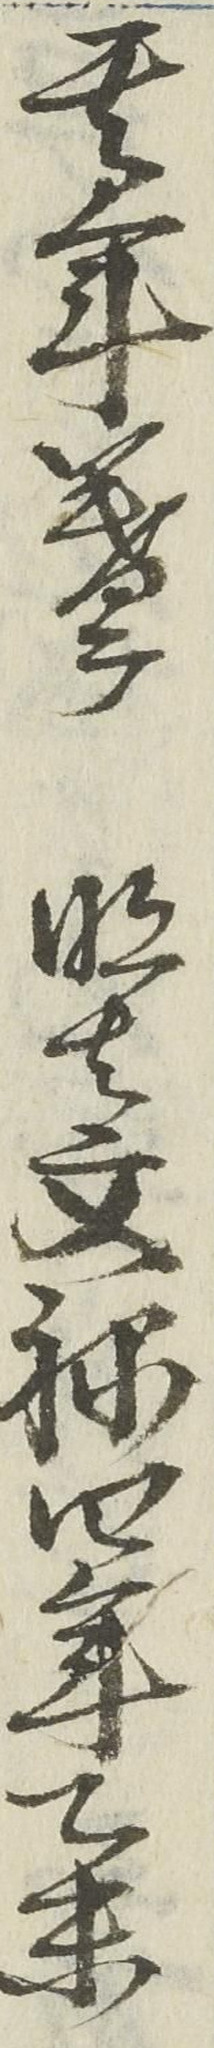其年暮テ明ハ文禄四年乙未
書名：伏水大地震
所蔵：東京大学地震研究所図書室 Earthquake Research Institute Library, The University of Tokyo, JAPAN
